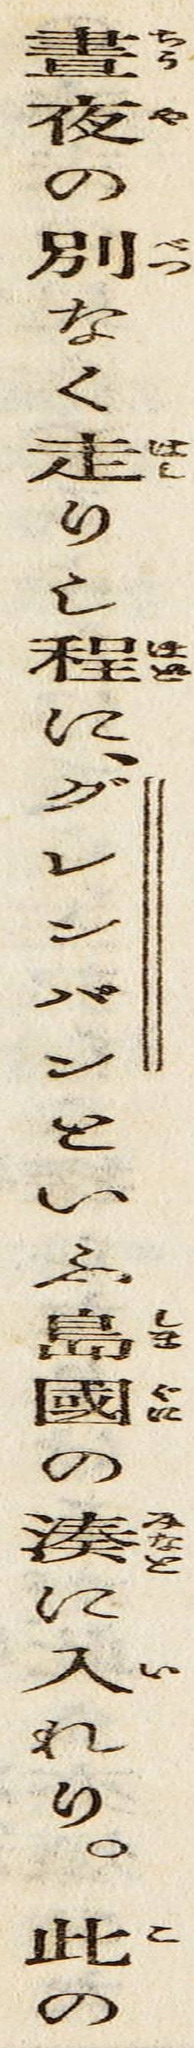昼夜の別なく走りし程に、グレンバンといふ島国の湊に入れり。此の
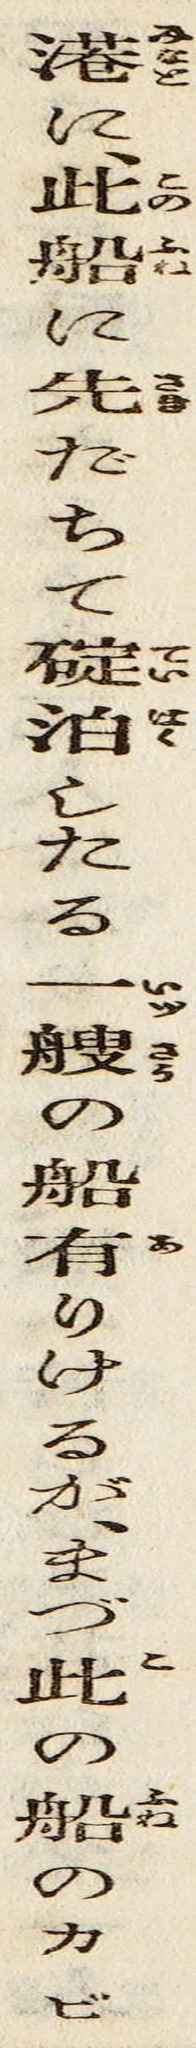港に、此船に先だちて碇泊したる一艘の船有りけるが、まづ此の船のカピ
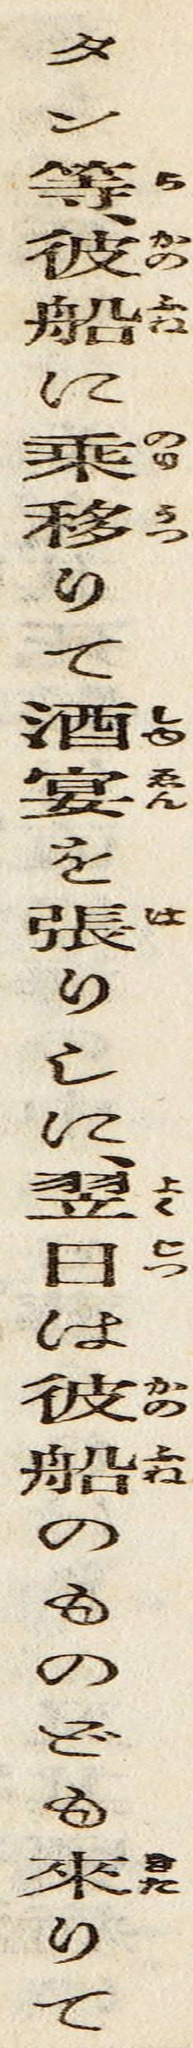タン等、彼船に乗移りて酒宴を張りしに、翌日は彼船のものども来りて
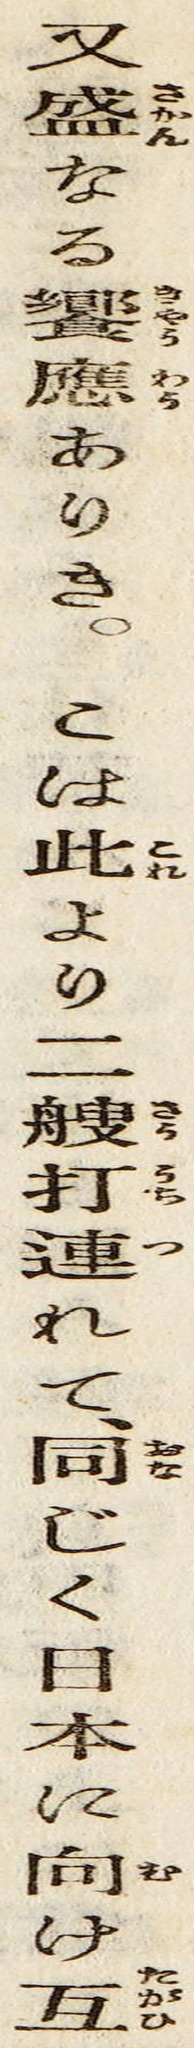又盛なる饗応ありき。こは此より二艘打連れて、同じく日本に向け互
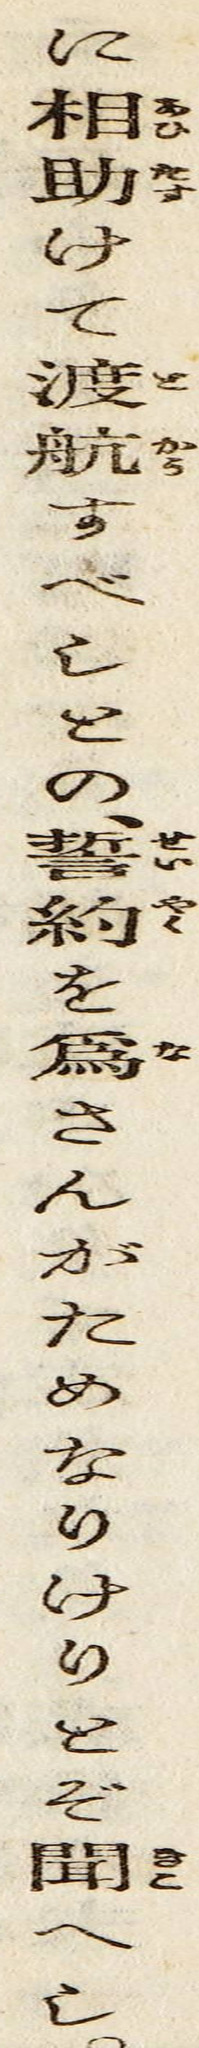に相助けて渡航すべしとの、誓約を為さんがためなりけりとぞ聞へし。
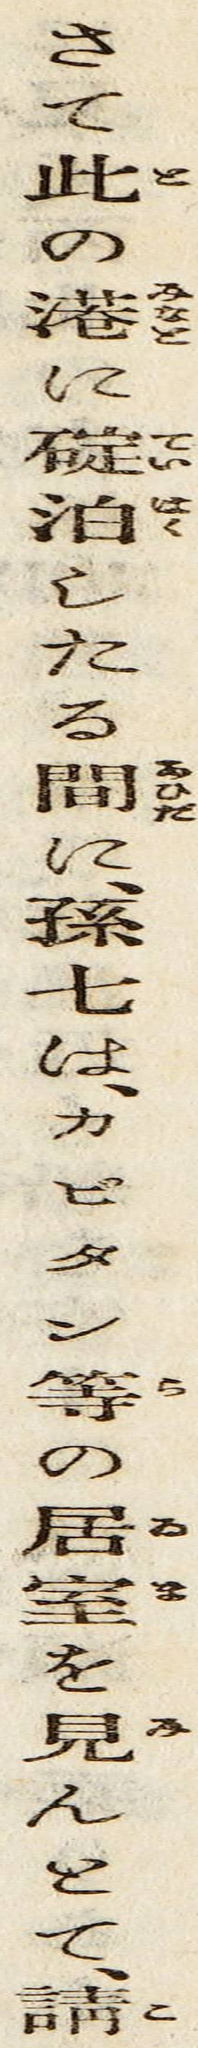さて此との港に碇泊したる間に、孫七は、カピタン等の居室を見んとて、請
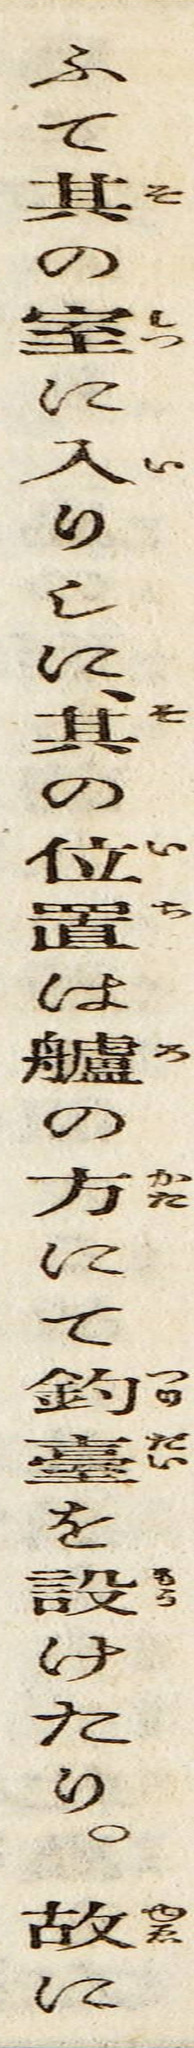ふて其の室に入りしに、其の位置は艫の方にて釣台を設けたり。故に
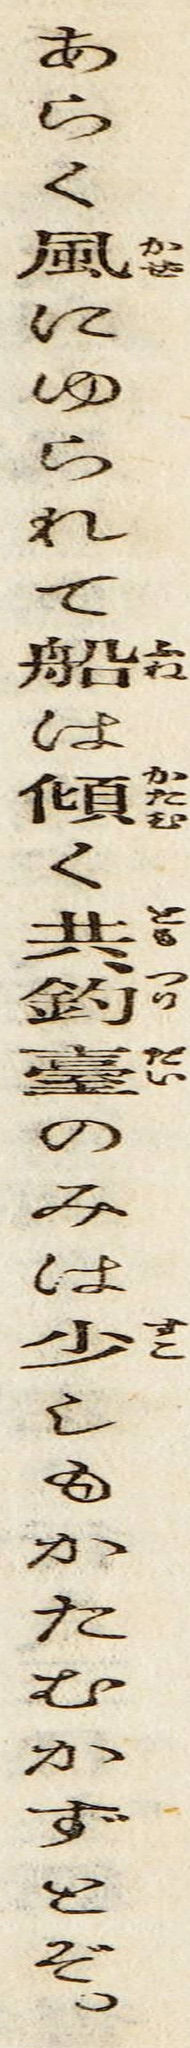あらく風にゆられて船は傾く共、釣台のみは少しもかたむかずとぞ。
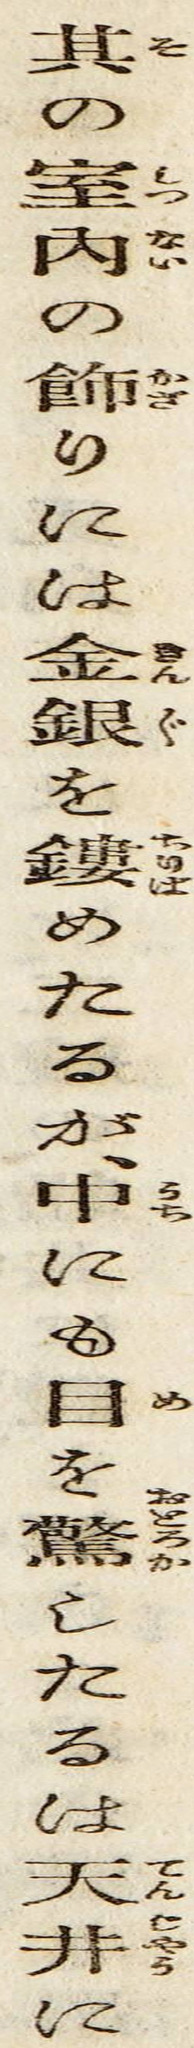其の室内の飾りには金銀を鏤めたるが、中にも目を驚したるは天井に
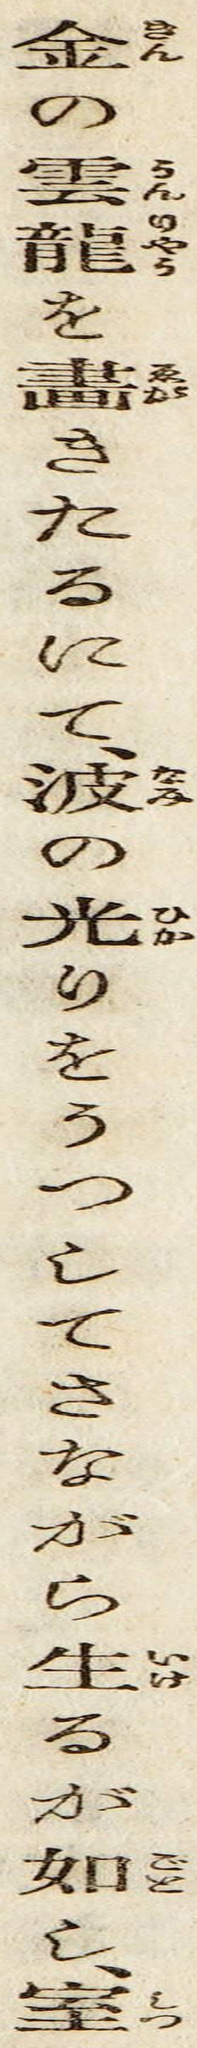金の雲竜を画きたるにて、波の光りをうつしてさながら生るが如し、室
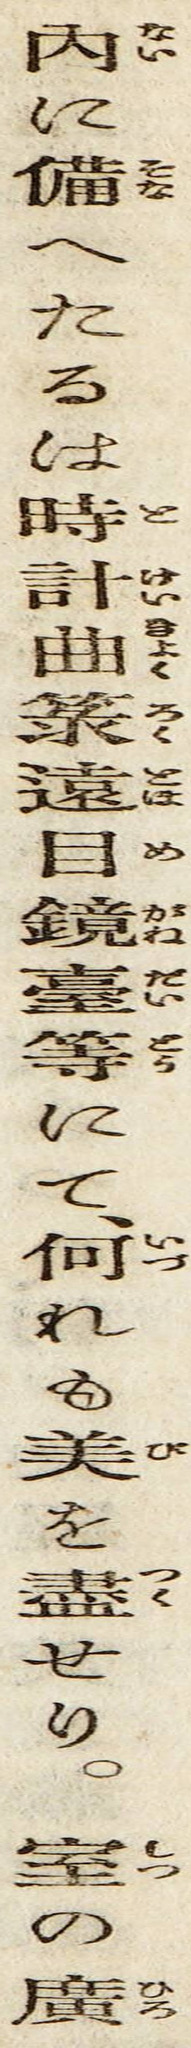内に備へたるは時計曲箓遠眼鏡台等にて、何れも美ぴを尽せり。室の広

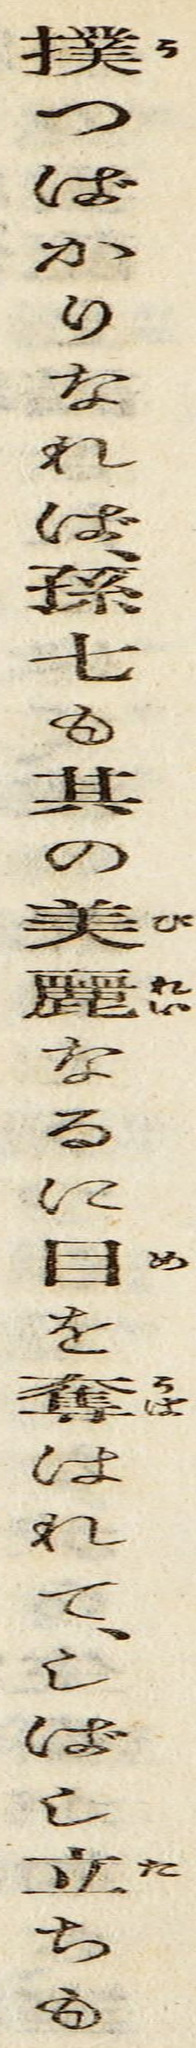撲つばかりなれば、孫七も其の美麗なるに目を奪はれて、しばし立ちも
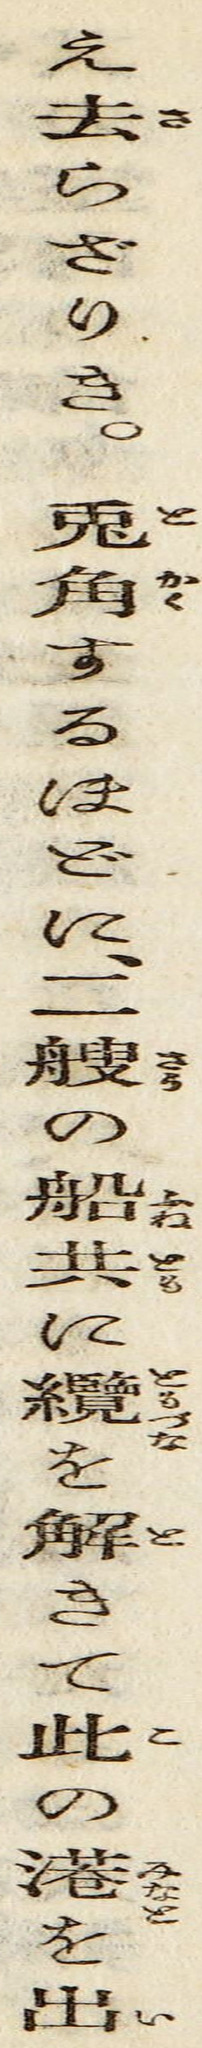え去らざりき。兎角するほどに、二艘の船共に纜を解きて此の港を出
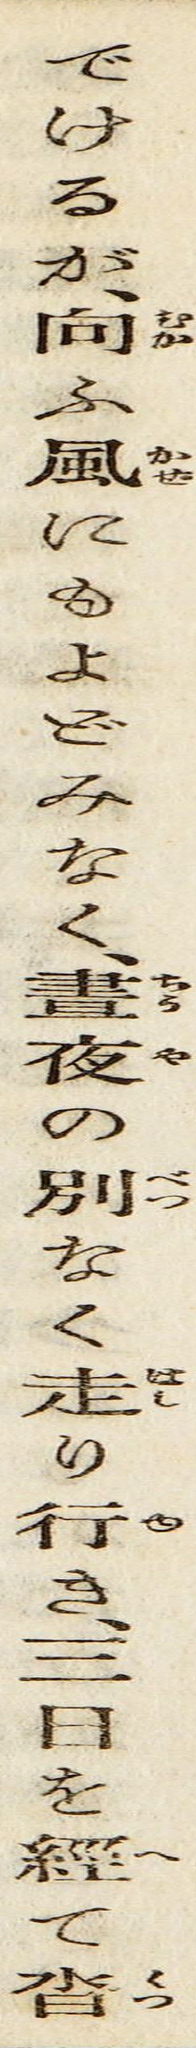でけるが、向ふ風にもよどみなく、昼夜の別なく走り行き、三日を経て沓
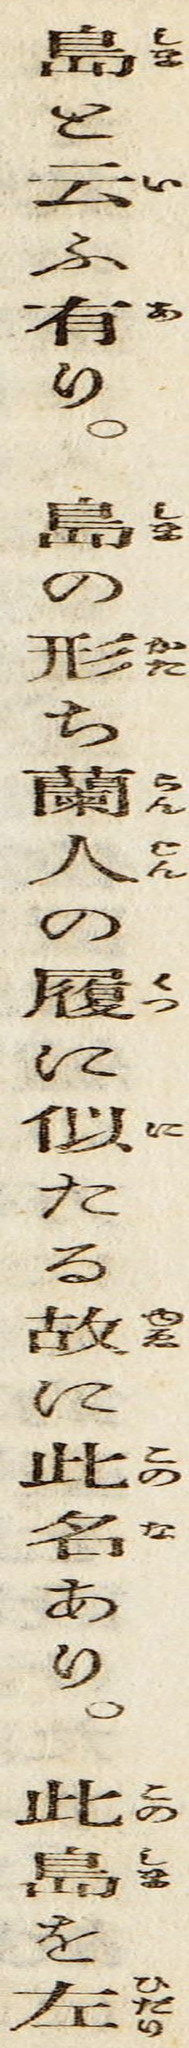島と云ふ有り。島の形ち蘭人の履に似たる故に此名あり。此島を左
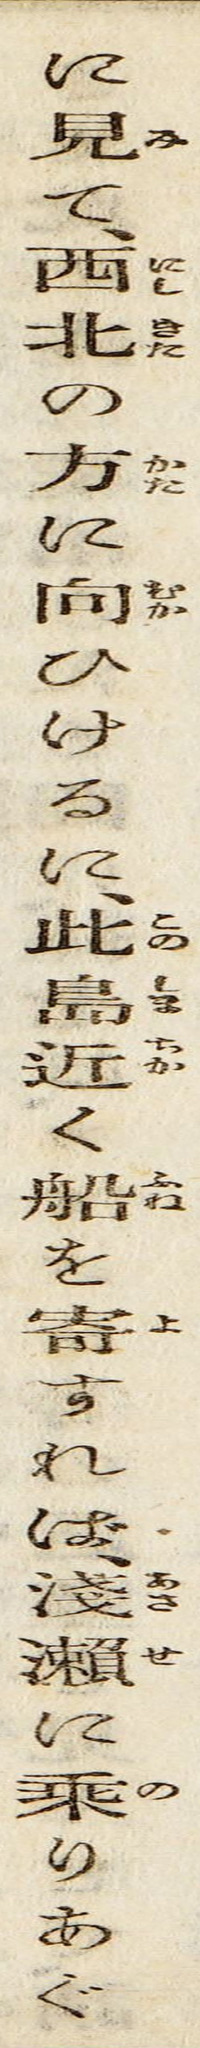に見て、西北の方に向ひけるに、此島近く船を寄すれば、浅瀬に乗りあぐ
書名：日本漂流譚
